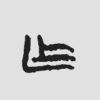乍
